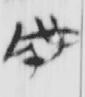成（城）
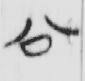公
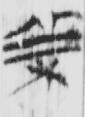样
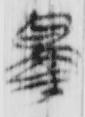睪
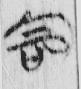命
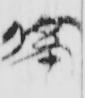倞
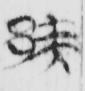邞
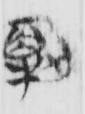解
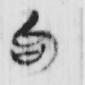句
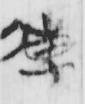傳
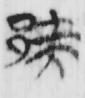邞
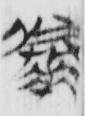○（拳）
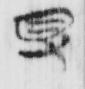○（得）
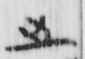之
